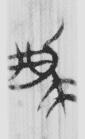{井力}
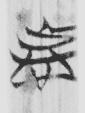者
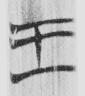王
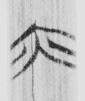亦
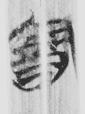酓
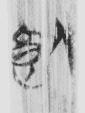飤
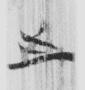之
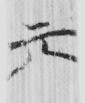亓
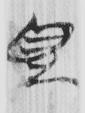見
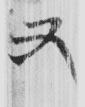又
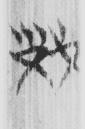{川又戈}
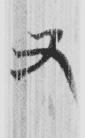又
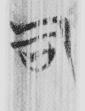司
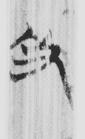及
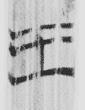王
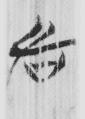左
